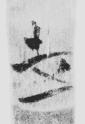{十五}
